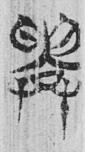興
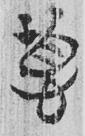惪（德）
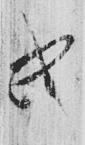女（如）
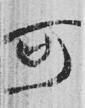可（何）
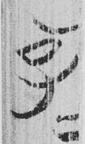孔子
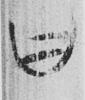曰
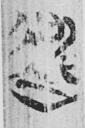○（舉）
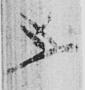之
